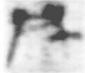凡
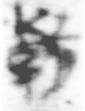新（新）
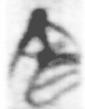官
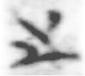之
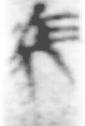馬
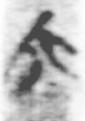六
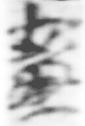𨍱（乘）
